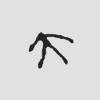大
